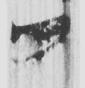月
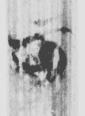可
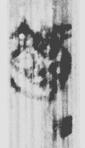智
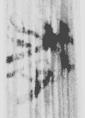歲
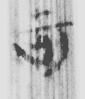可
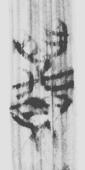贎
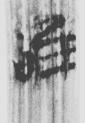唯
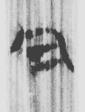今
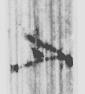之
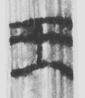王
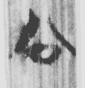公
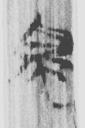蜀
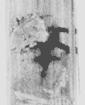不
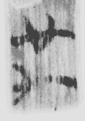{廿九}
